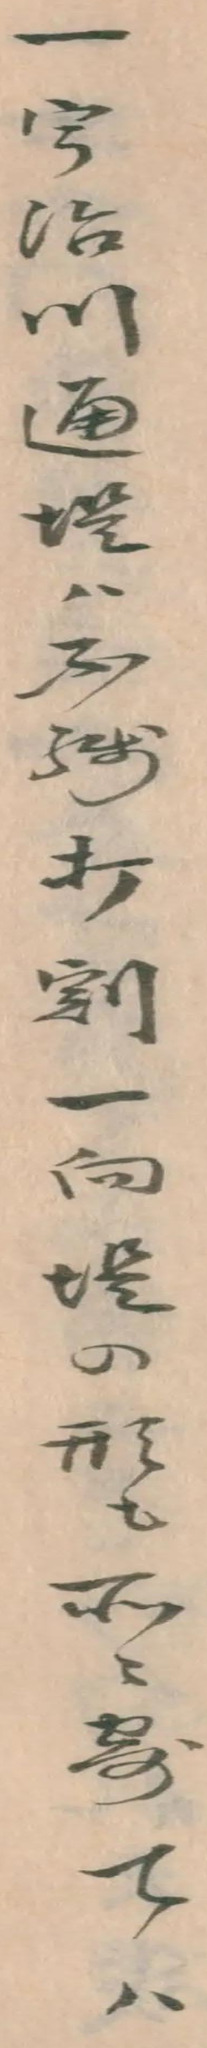一宇治川通堤ハ不残打割一向堤の形も所二寄てハ
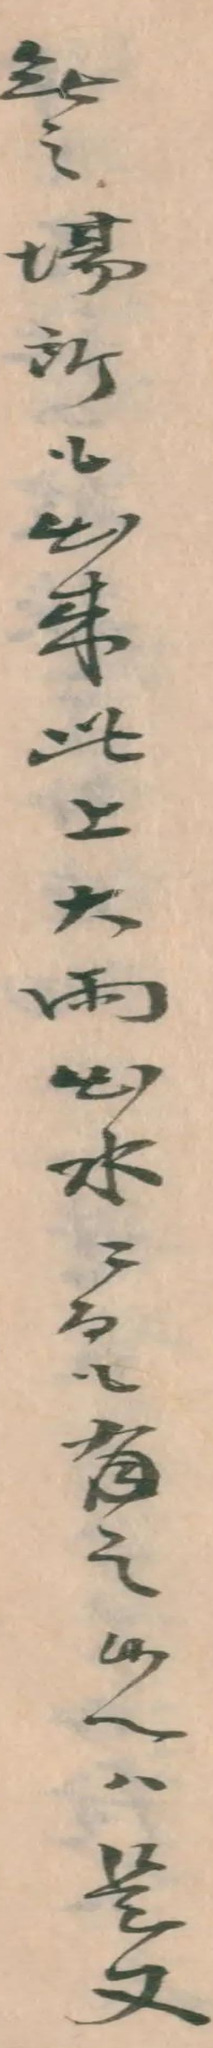無之場所も出来此上大雨出水二ても有之候へハ是又
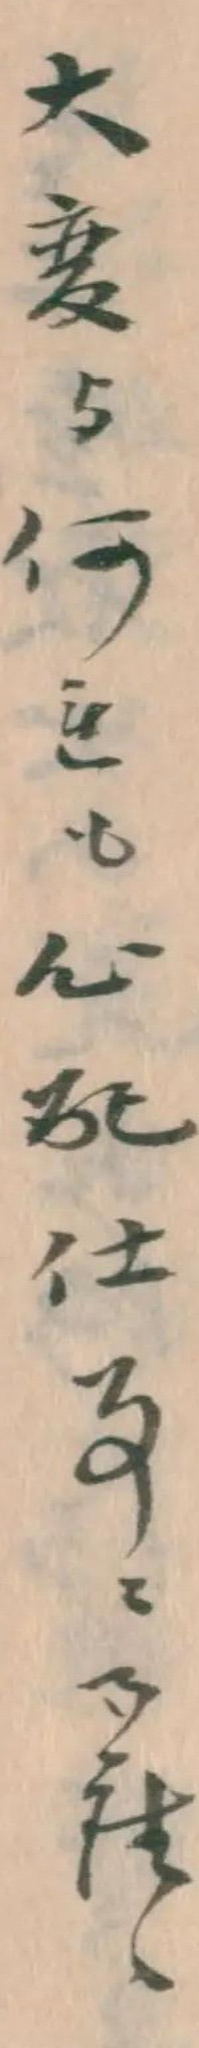大変と何とも心配仕事二御座候
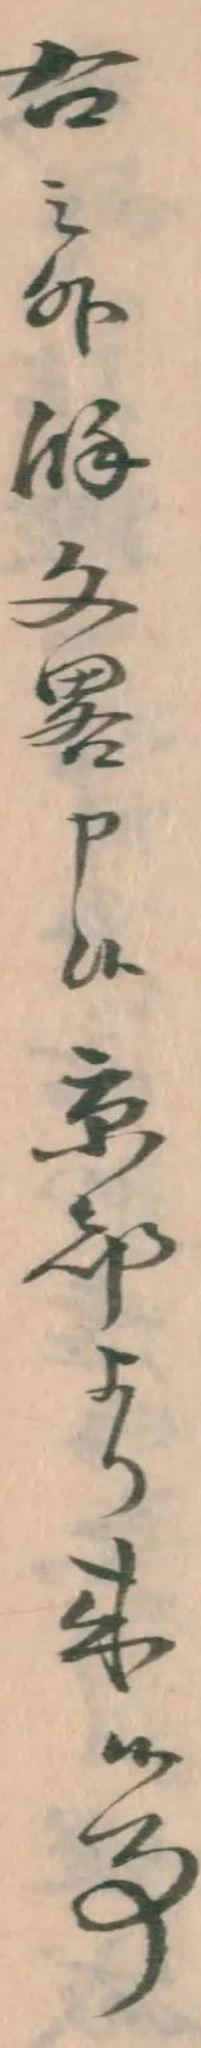右之外余分畧申候京都より来候事
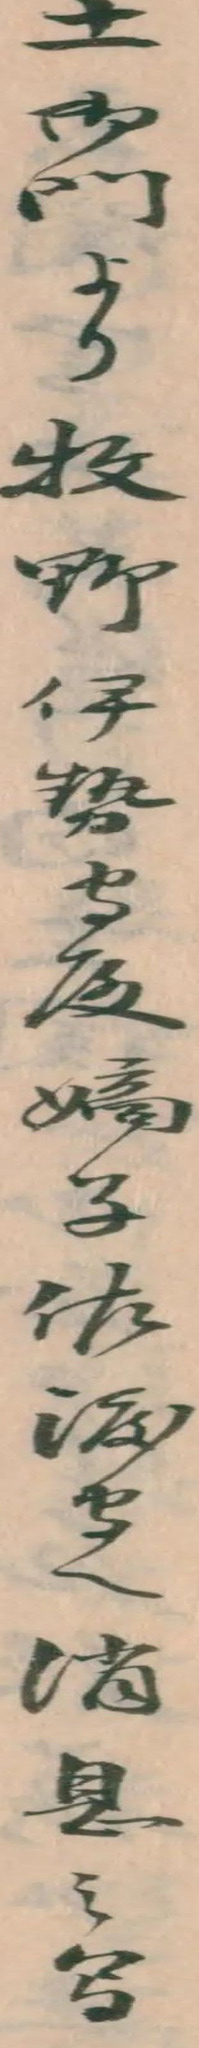土御門より牧野伊勢守殿嫡子佐渡守殿へ消息之間
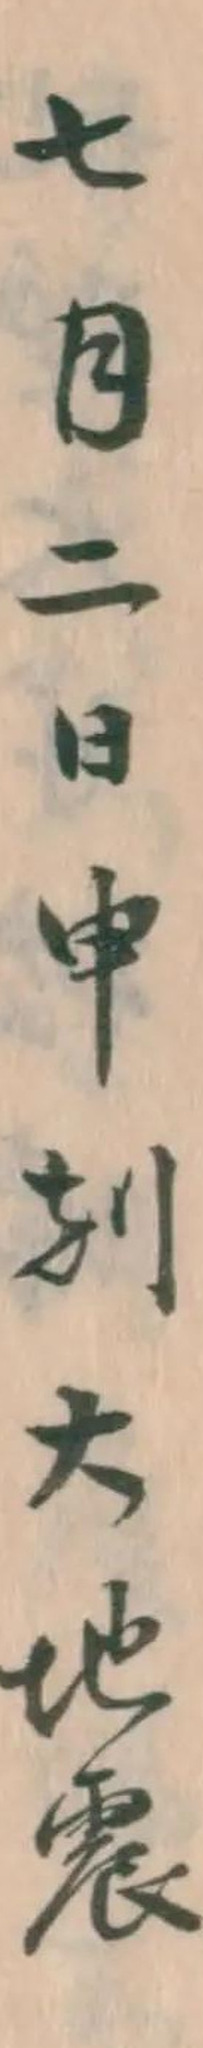七月二日申刻大地震」
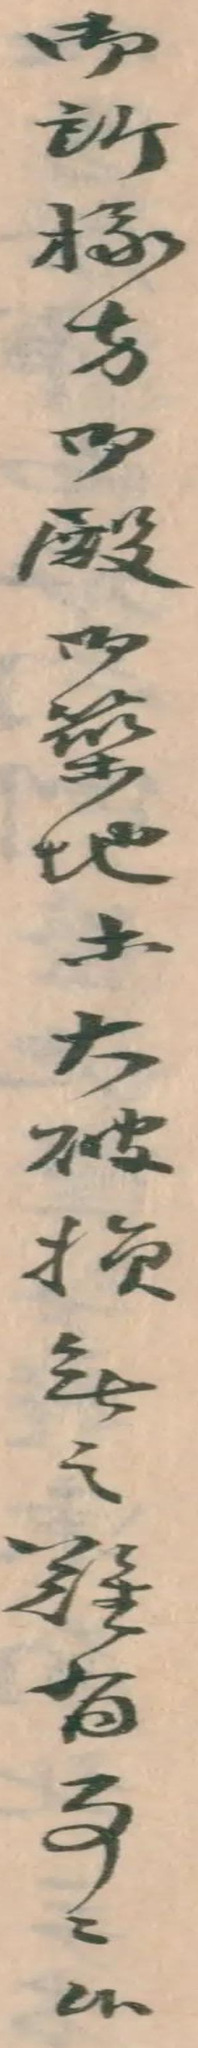御所様方御殿御築地等大破損無之難有事二候
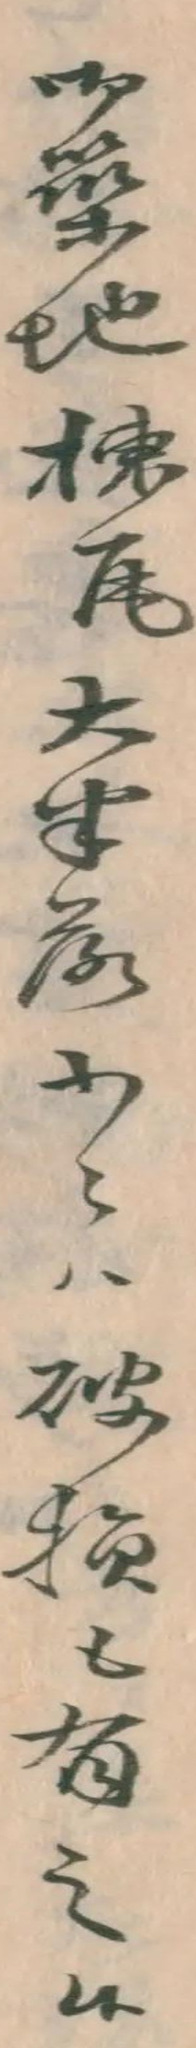御築地棟瓦大半落候二ハ破損も有之候
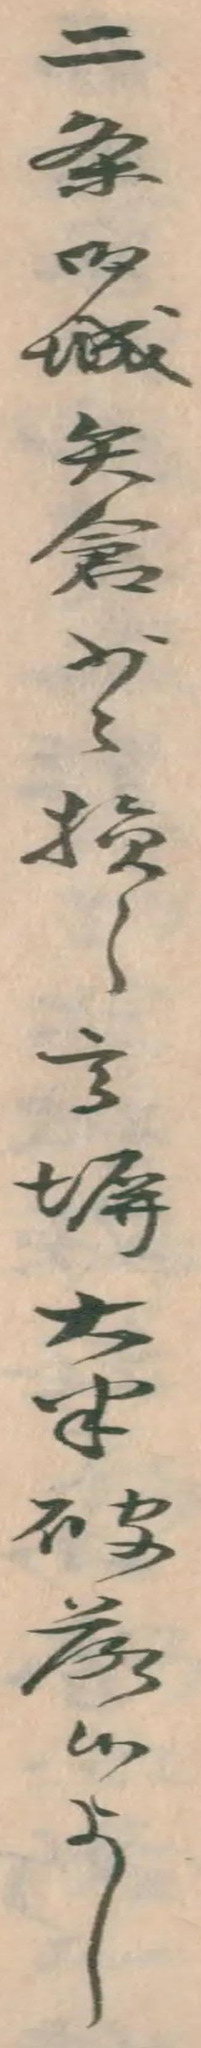二条御城矢倉少々損し高塀大半破落候よし
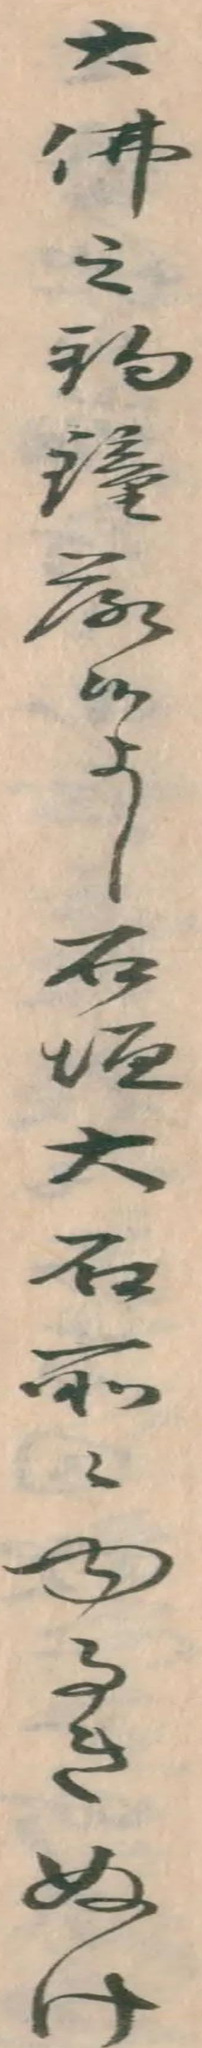大仏之釣鐘落候よし石垣大石所々ゆるきぬけ
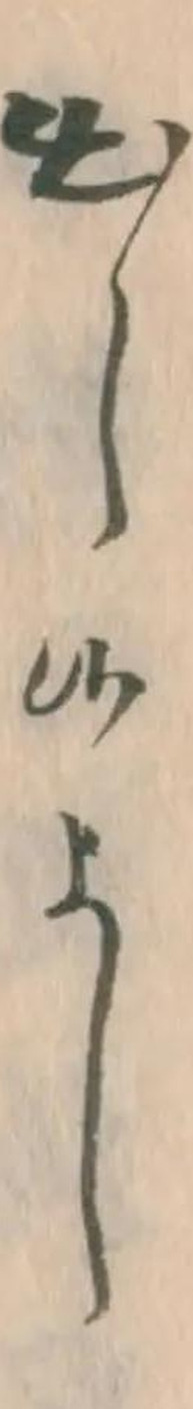出し候よし
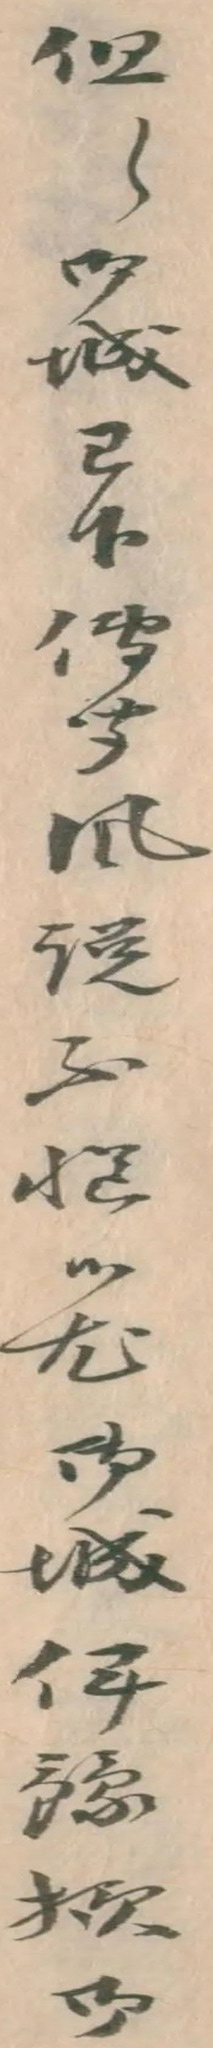但し御城已下仏声風説不慥候尤御城伊豫様御
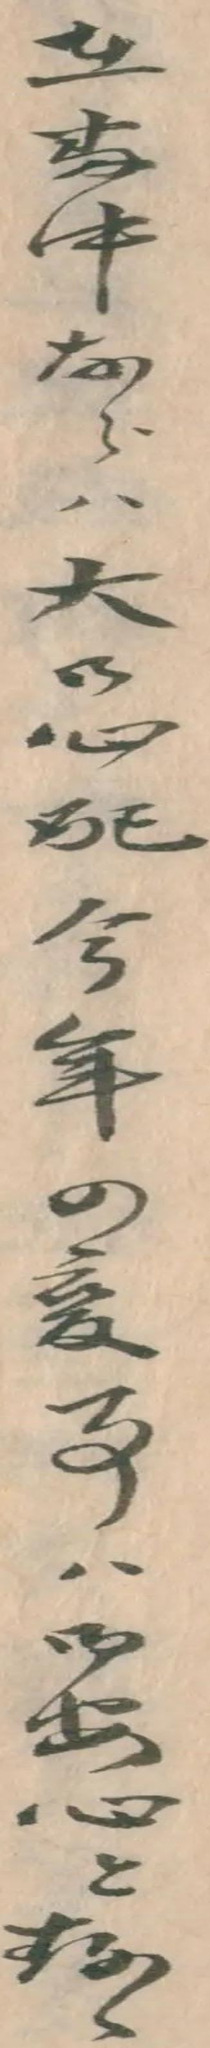在藩中ならハ大御心配今年の変事ハ御安心と存候

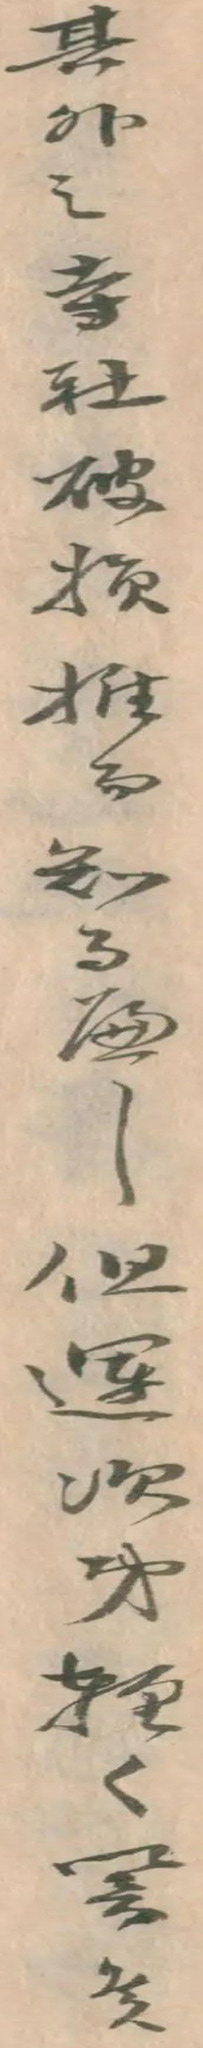其外之寺社破損推而知るへし但運次第軽く響候
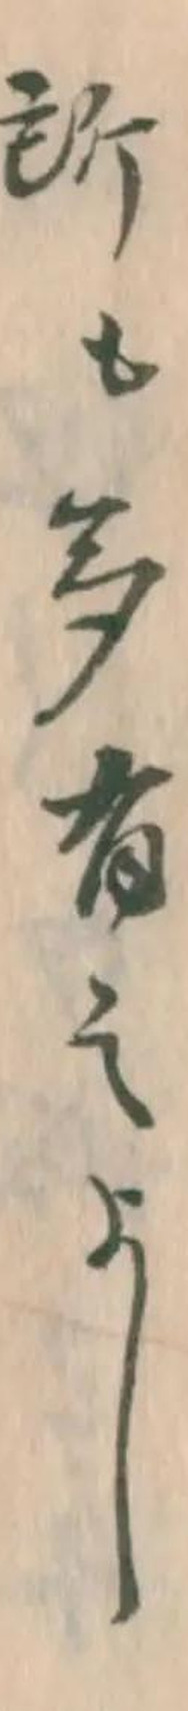所も多有之よし
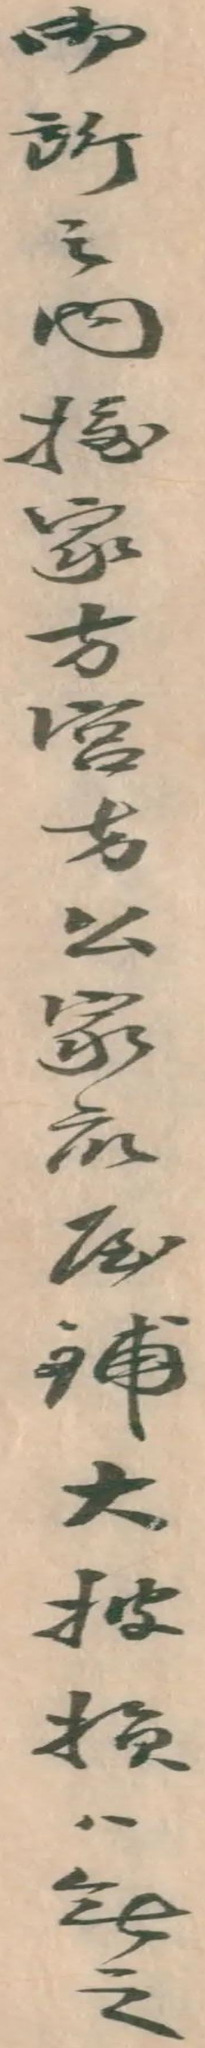御所之内摂家方宮方公家衆屋鋪大破損ハ無之
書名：京都地震
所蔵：国立国会図書館 National Diet Library, JAPAN
